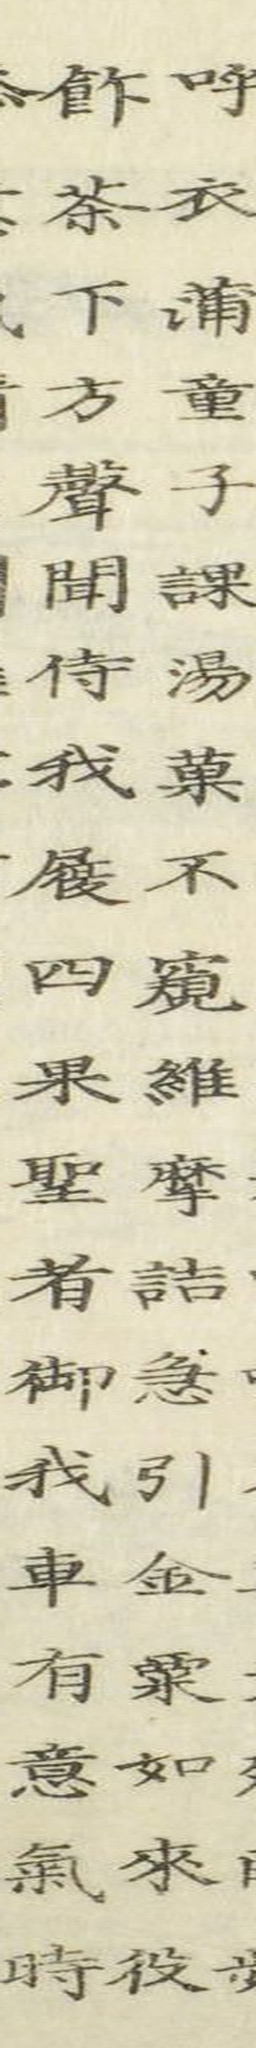飦茶下方聲聞侍我履四菓聖者御我車有意氣時
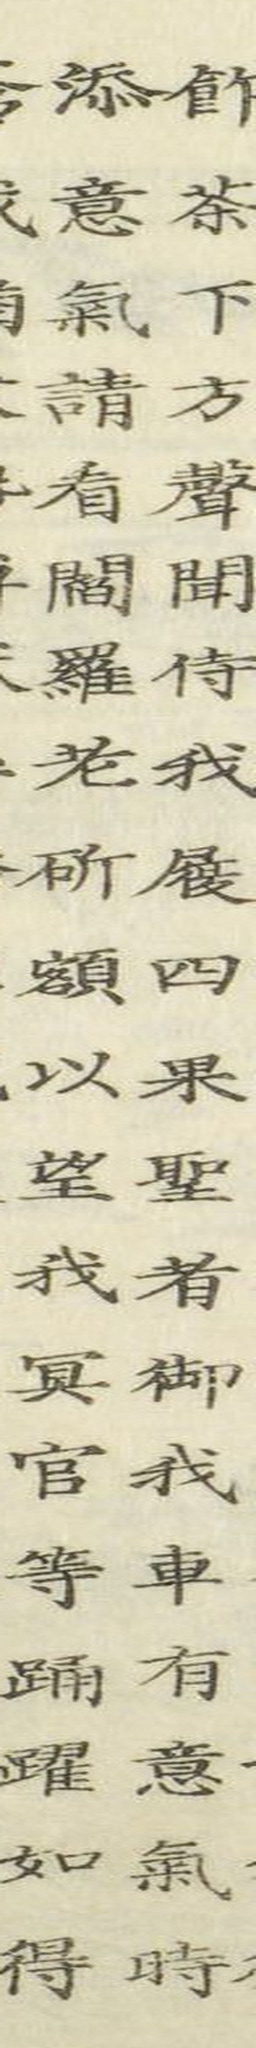添意氣請看𨵻羅老斫額以望我冥官等踊躍如得
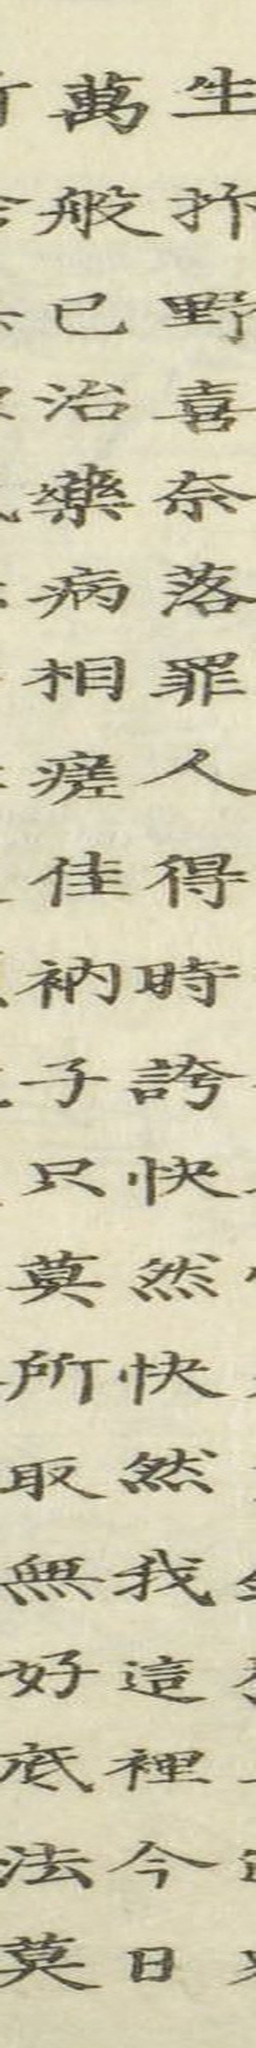萬般已治藥病相瘥佳衲子只莫所取無好底法莫
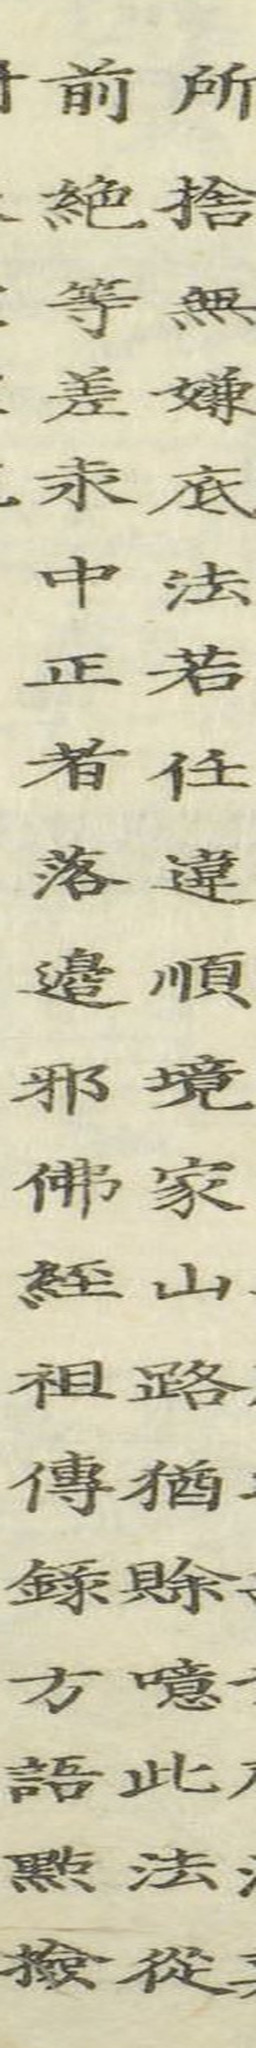前絶等差汞中正者落邉邪佛經租傳録方語黙撿
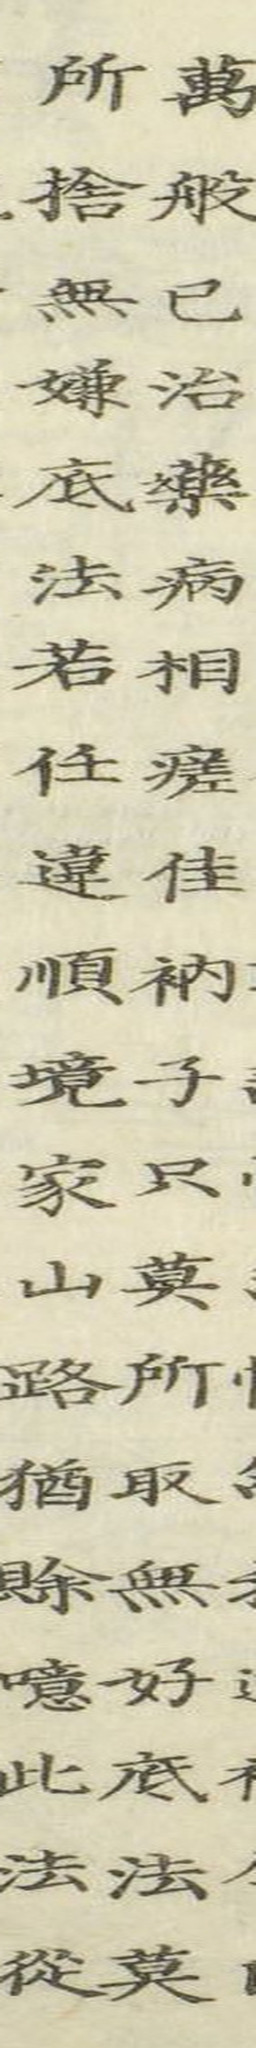所捨無嫌底法若任違順境家山路猶賖噫此法從
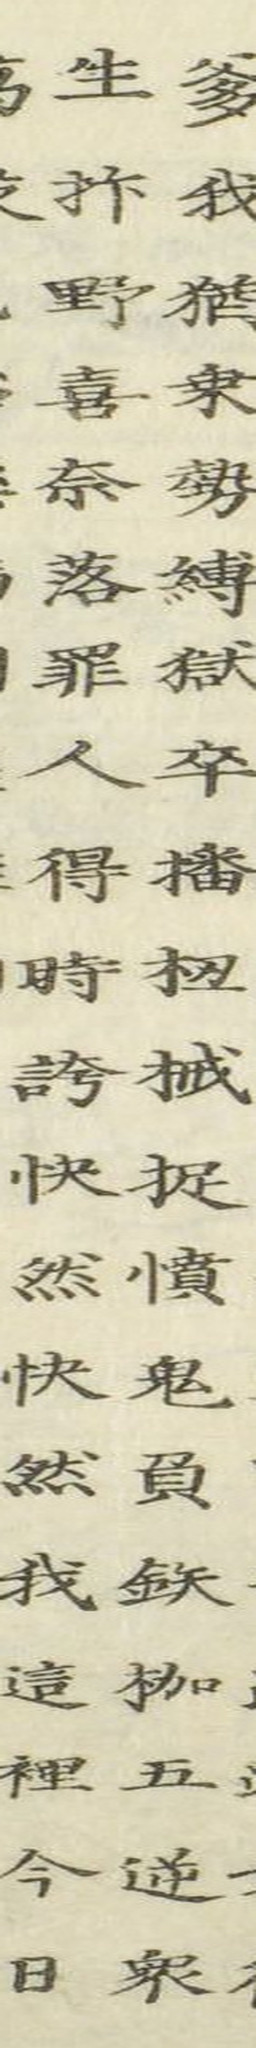生𣏣野喜奈落罪人得時誇快然快然我這裡今日
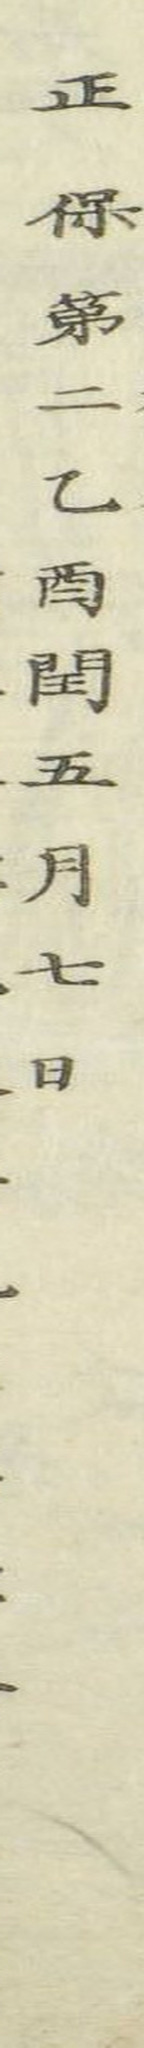正保第二乙酉閏五月七日
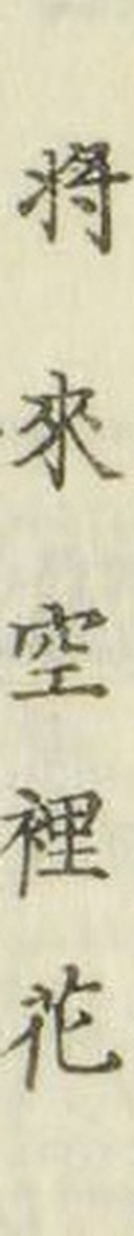將來空裡花
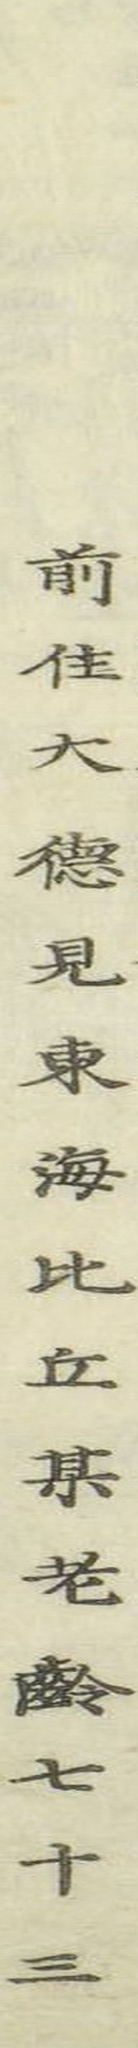前住大德見東海比丘某老齢七十三
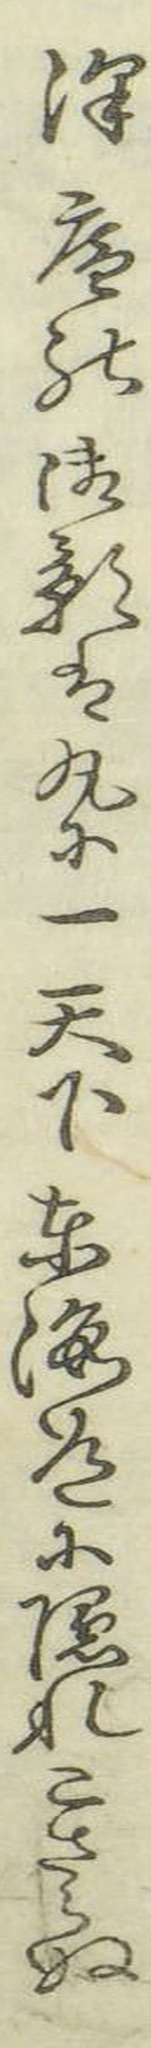澤庵の御影は丸に一天下東海道に隠れこさらぬ
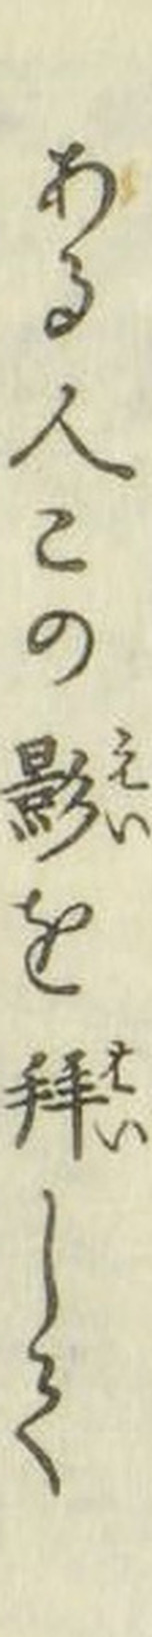ある人この影を拜して

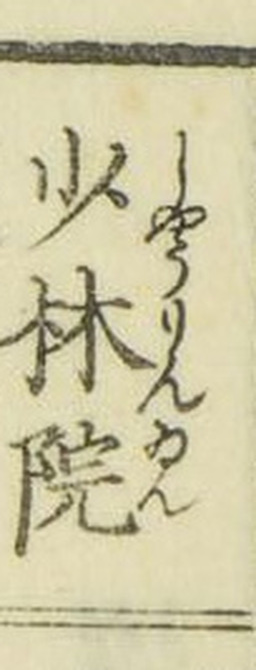少林院
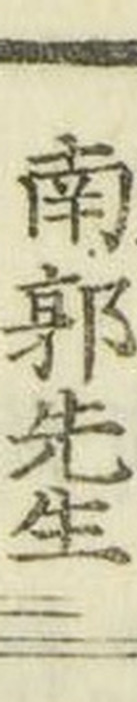南郭先生
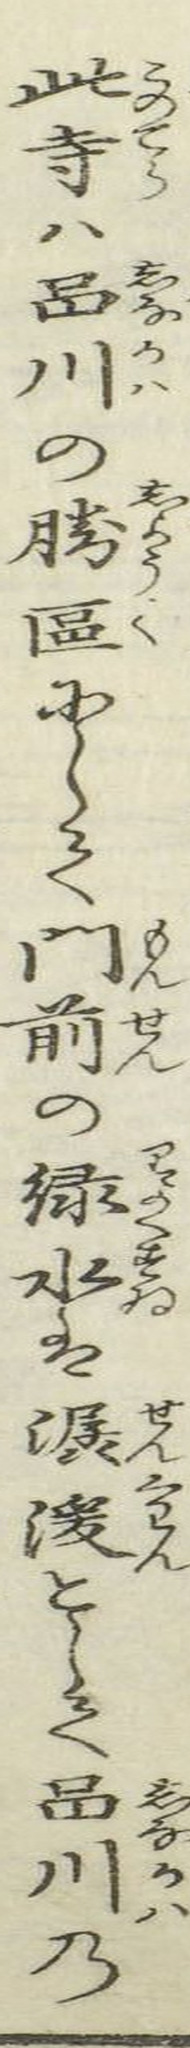此寺は品川の勝區にして門前の緑水は潺湲として品川の
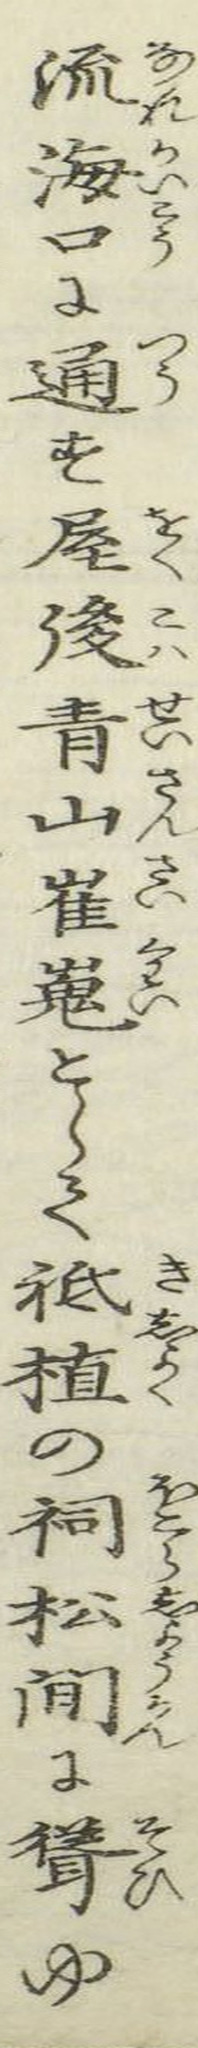流海口に通す屋後青山崔嵬として祇植の祠松間に聳ゆ
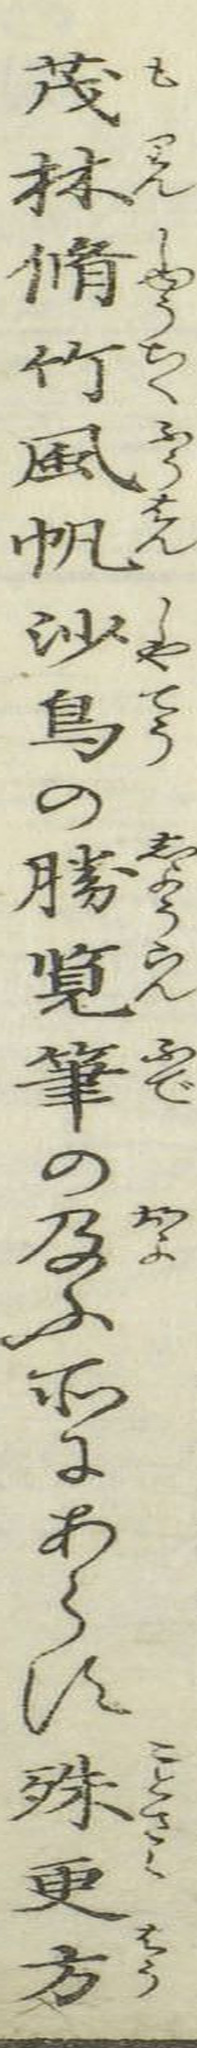茂林脩竹風帆沙鳥の勝覧筆の及ふ所にあらす殊更方
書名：江戸名所図会 20巻 巻之4
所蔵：東京学芸大学教育コンテンツアーカイブ
